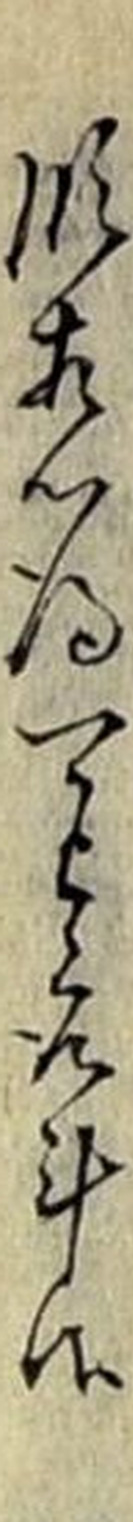段相心得可被取斗候
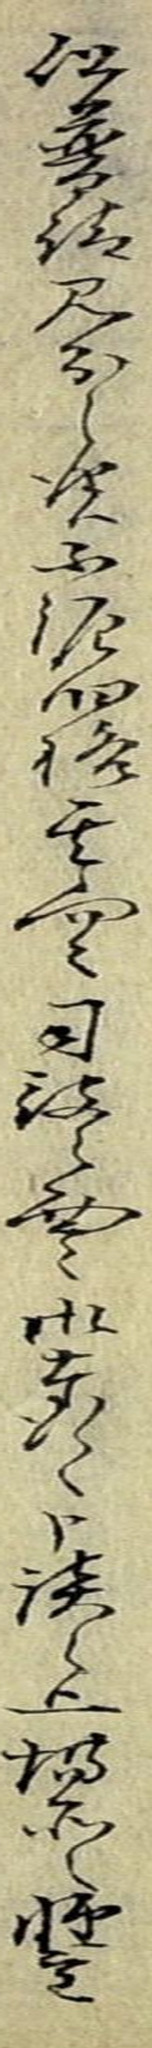但普請見分之儀は不泥旧格其向々司役之面々御奉行へ申談之上場所之軽重
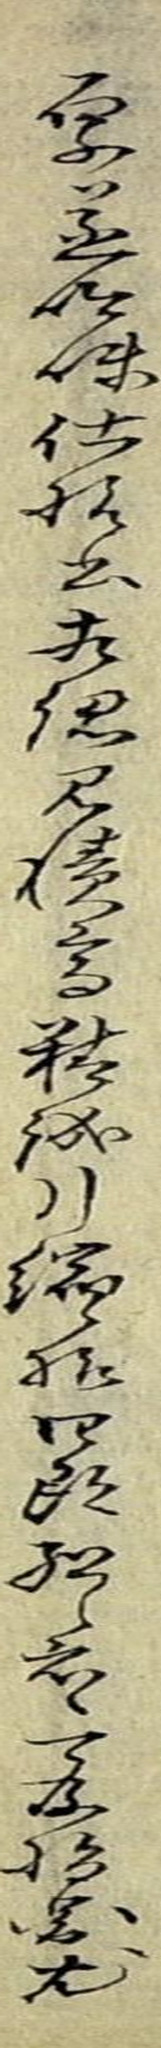厚遂吟味仕様書相認見積高精誠引縮候様四郡組之者へ可及指図尤
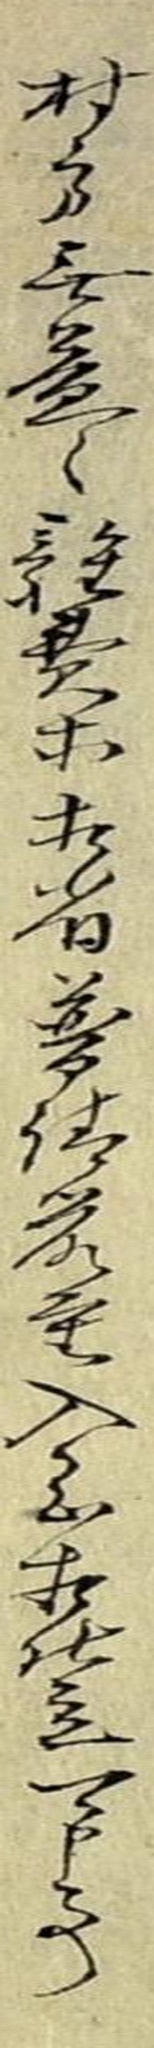村方無益之雑費等相省普請厳重入念相仕立可申事
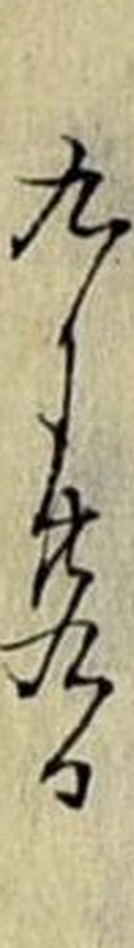九月廿九日
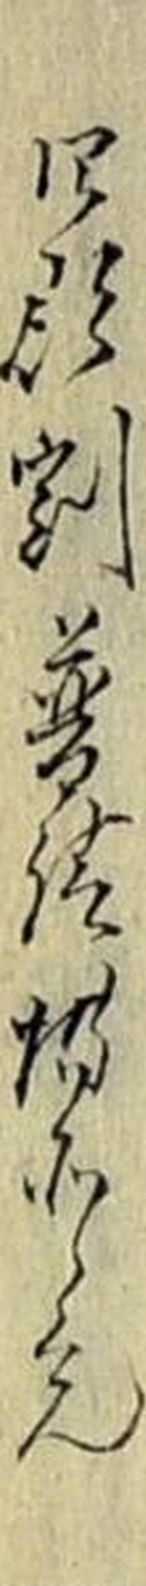四郡割普請場所之覚
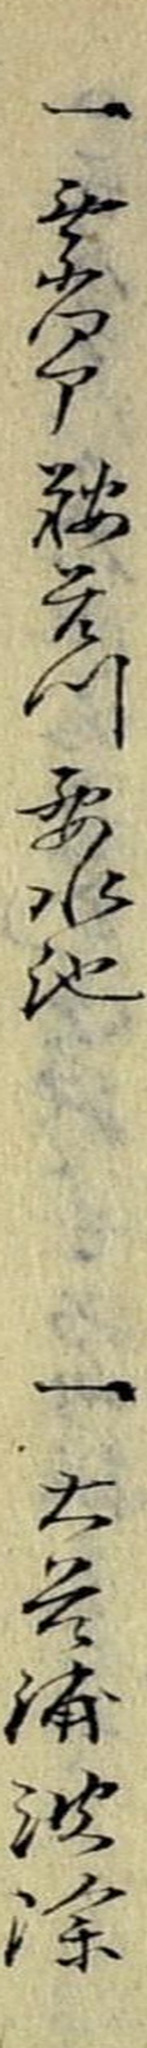一栗田部鞍谷川要水池一大谷浦波除
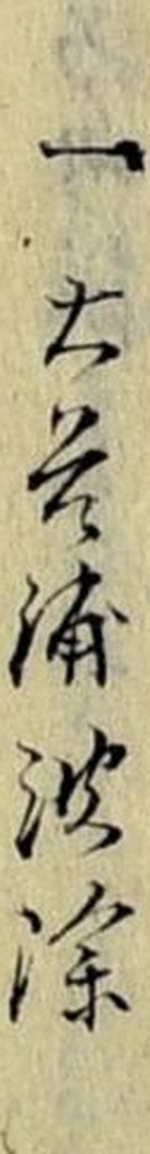一四ヶ浦波除
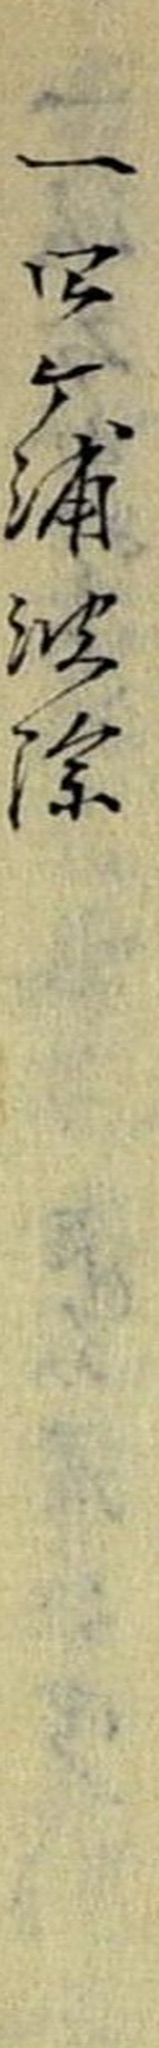一四ヶ浦波除
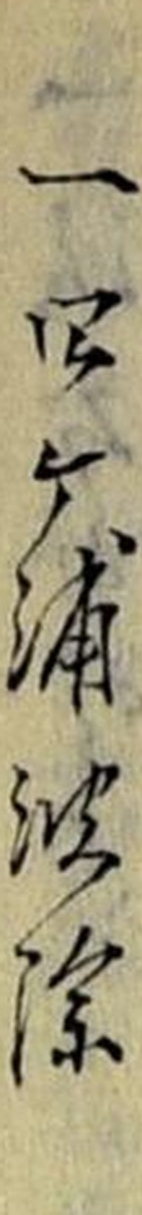一四ヶ浦波除
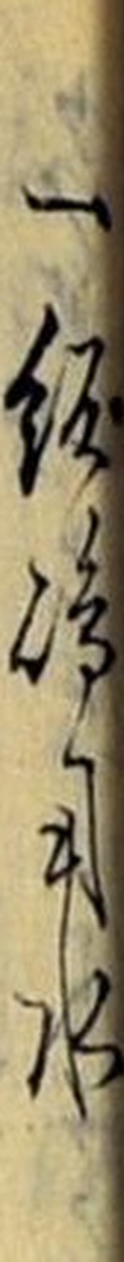一飯嶋用水
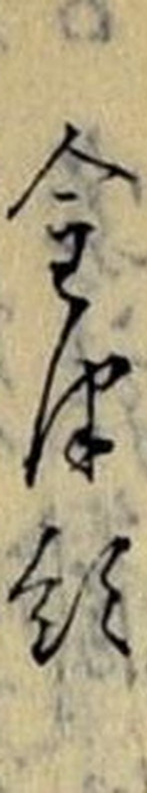金津領
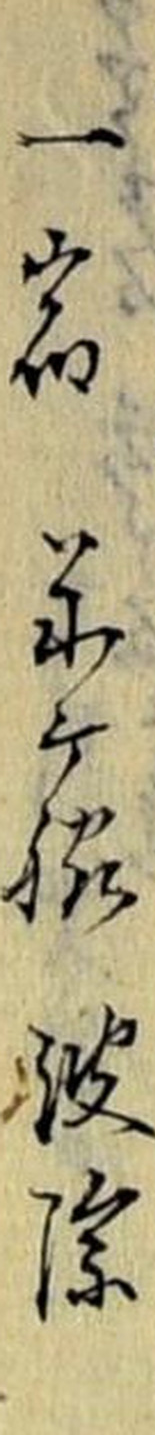一宿米ケ脇の波除
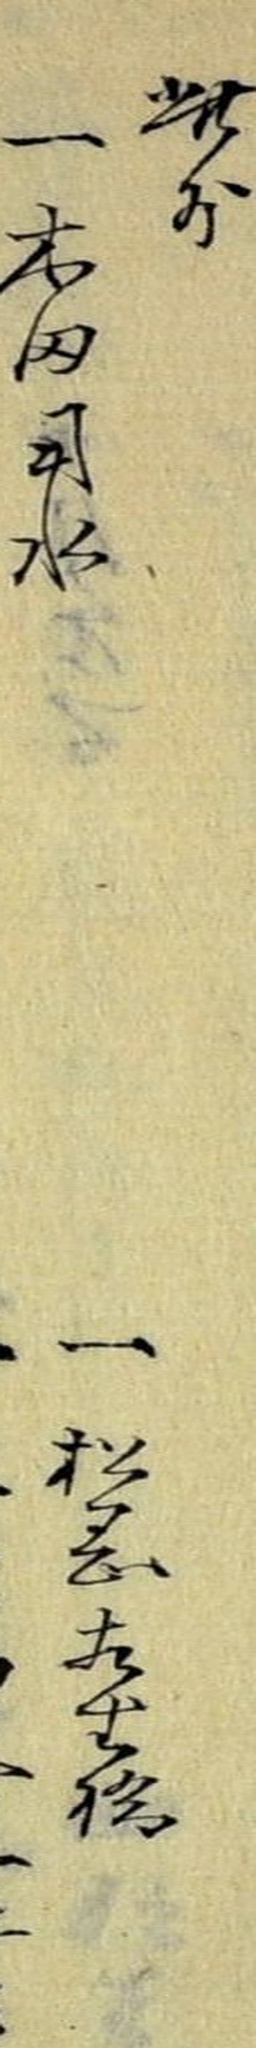一木田用水一松岡相生橋
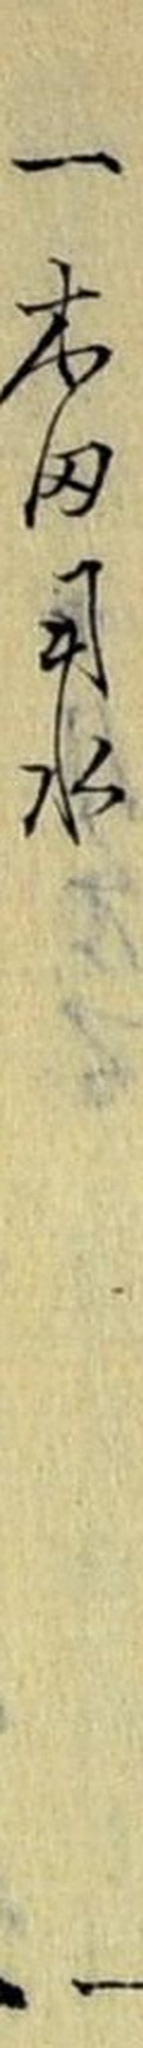一飯嶋用水
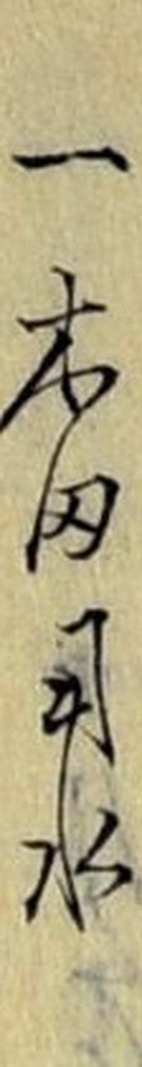一飯嶋用水
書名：命令之部 六
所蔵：福井県文書館 Fukui Prefectural Archives
